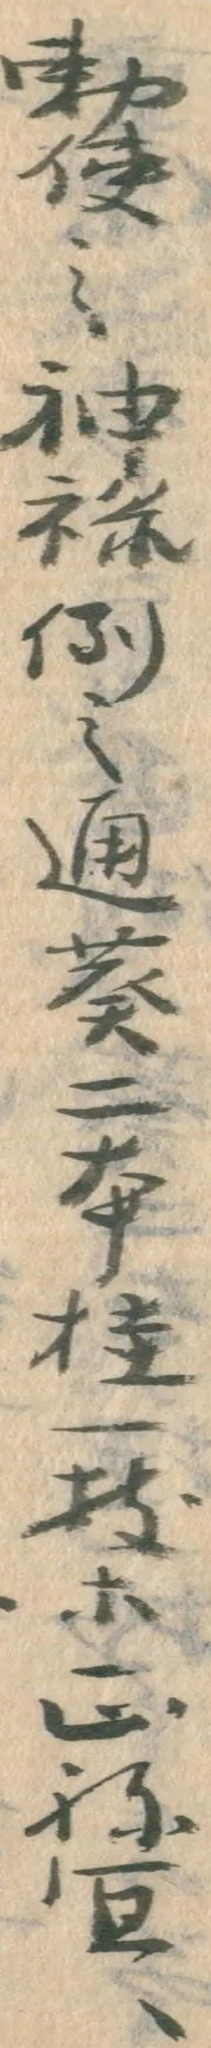勅使之神禄例之通、葵二本・桂一枝等正称宜へ
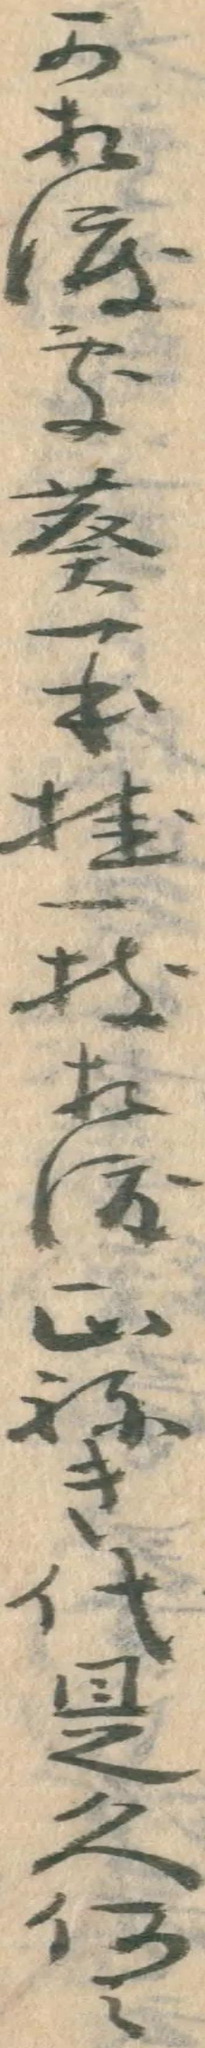可相渡處、葵一本・桂一枝相渡、正ねき代是久何之
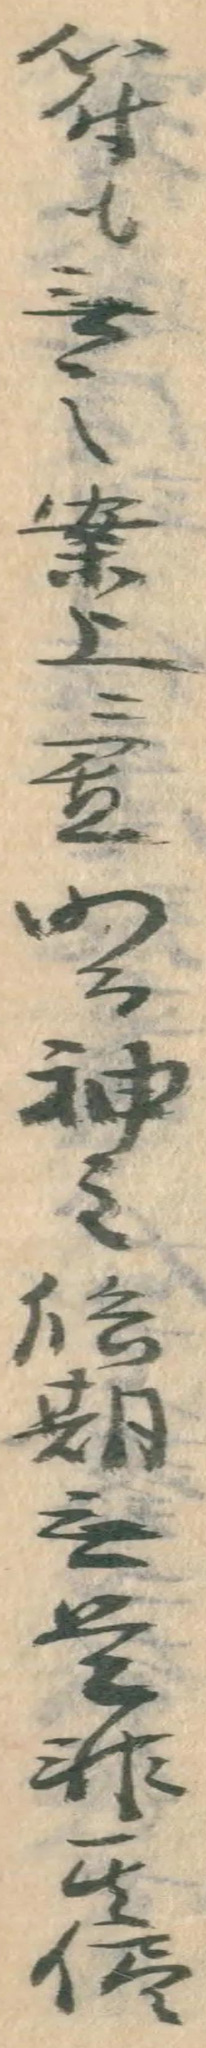心付も無之案上に置、仍而神主臨期無是非其侭

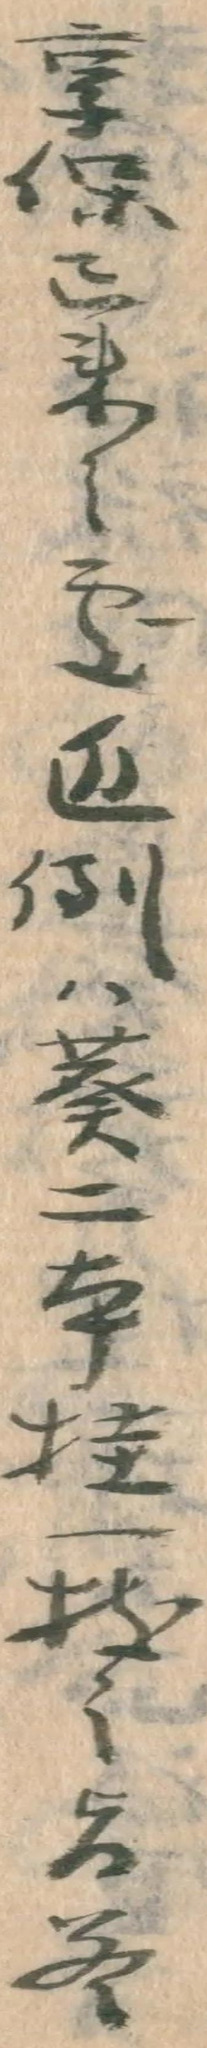享保已来之處近例ハ、葵二本・桂一枝之旨、葵
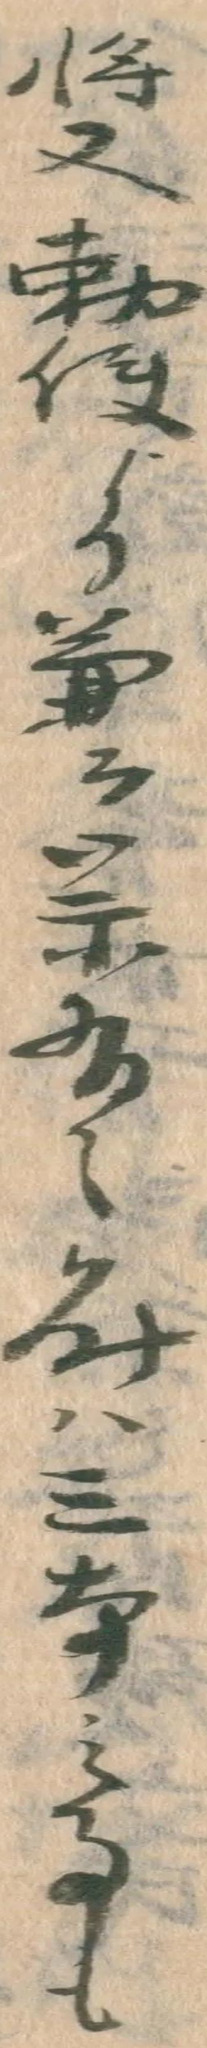将又勅使より兼而御示有之候時は、三本之事も、
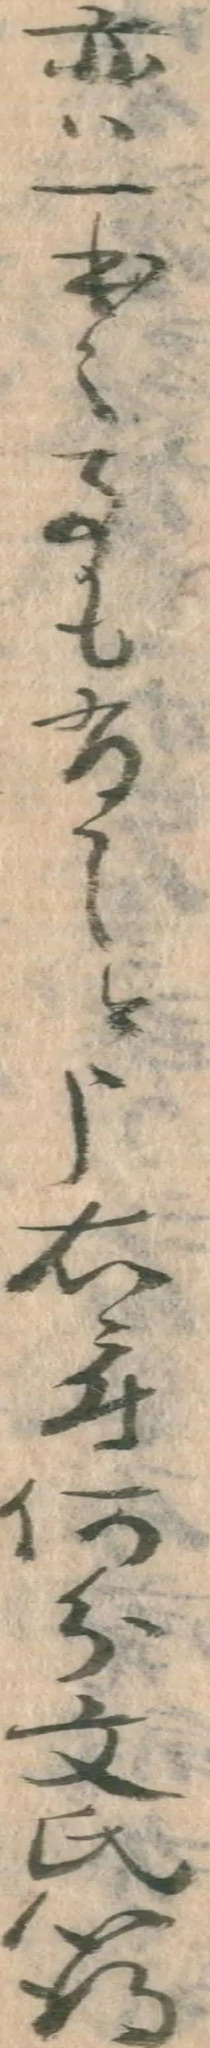亦は一本之事も有之と申、右ニ付、何分文氏心得
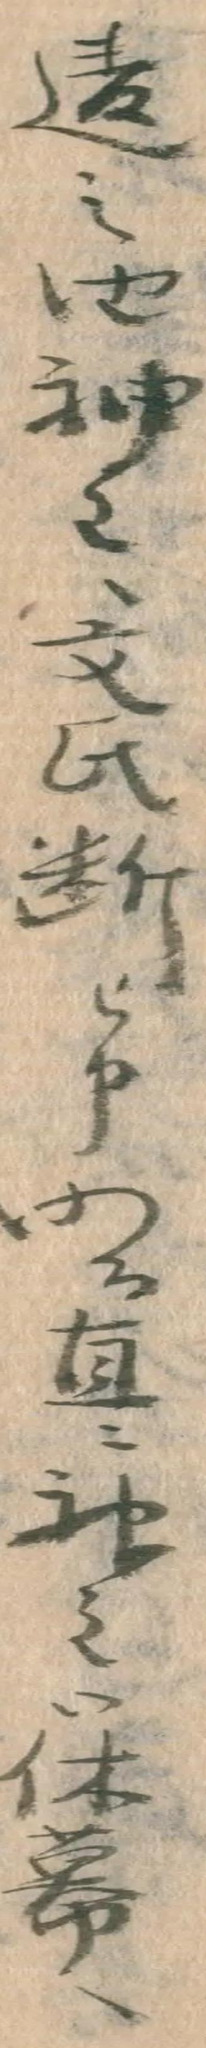違之由、神主へ文氏断被申、内而直ニ神主御休幕へ
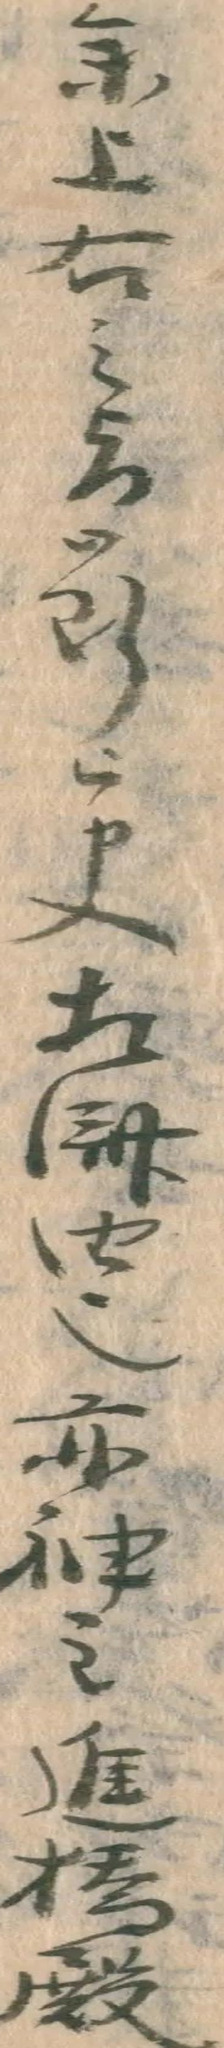参上、右之旨御断被申入相済由也、亦神主進橋殿
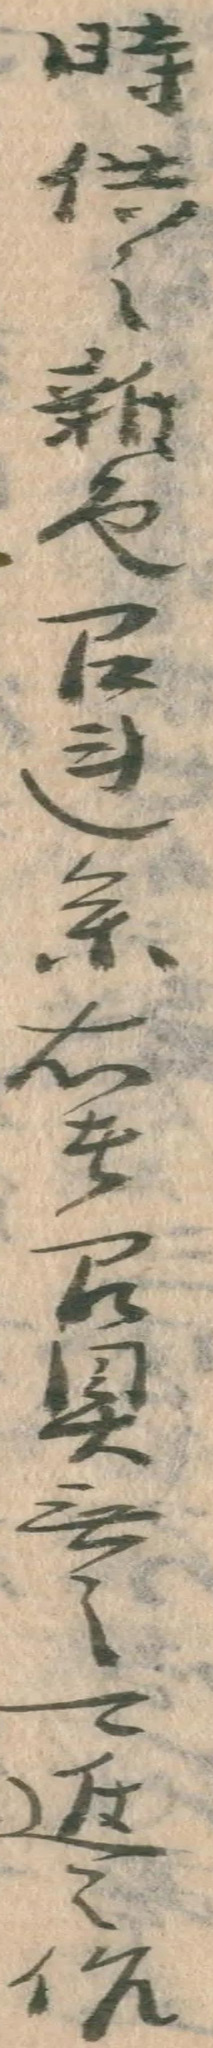時。供之雑色・召連参、右者召具無之可進之作
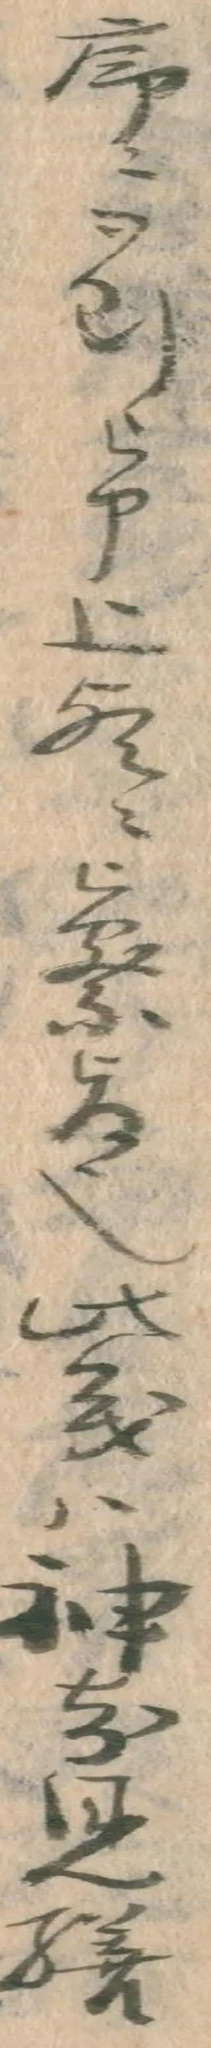序ニ御断被申上歟ニ被察旨也、此義ハ神前見繕
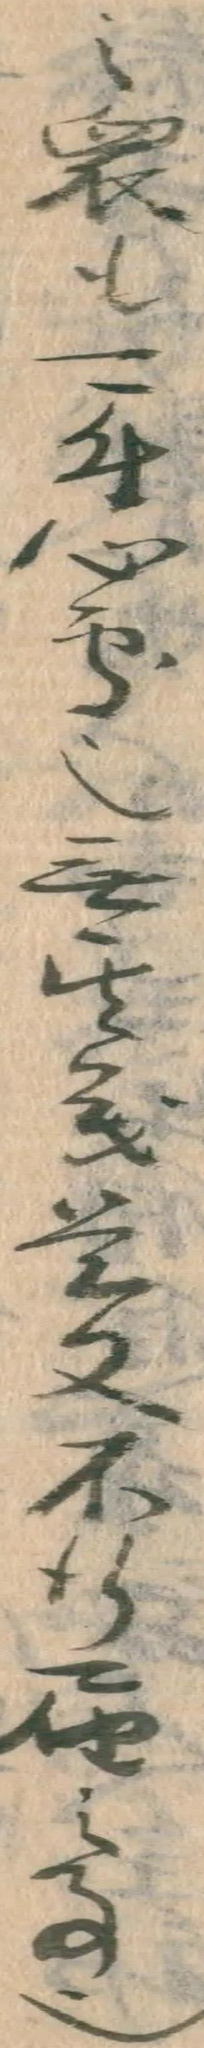之衆も可付心處也、無其義、是又不行届之事也、
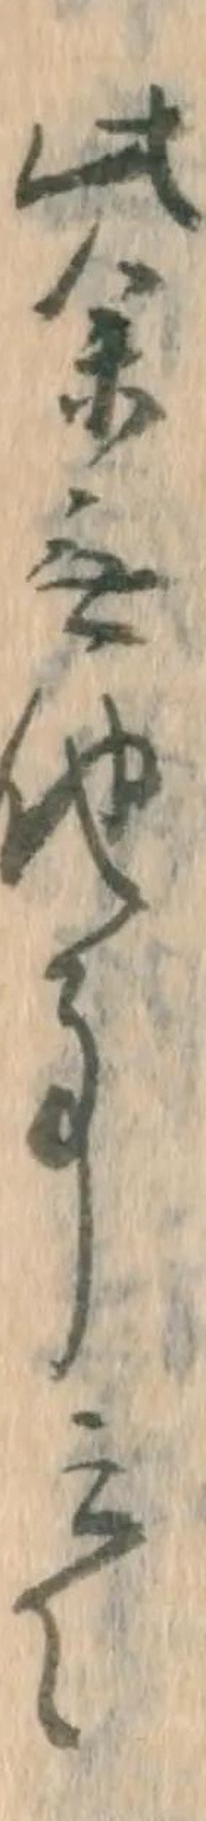此余無他事云々、
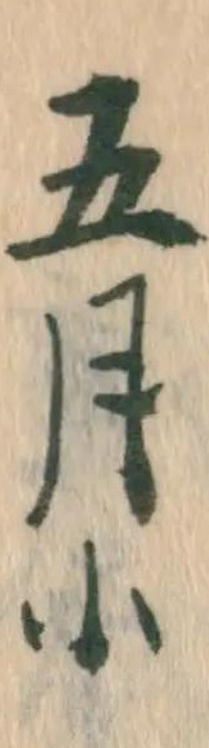五月小
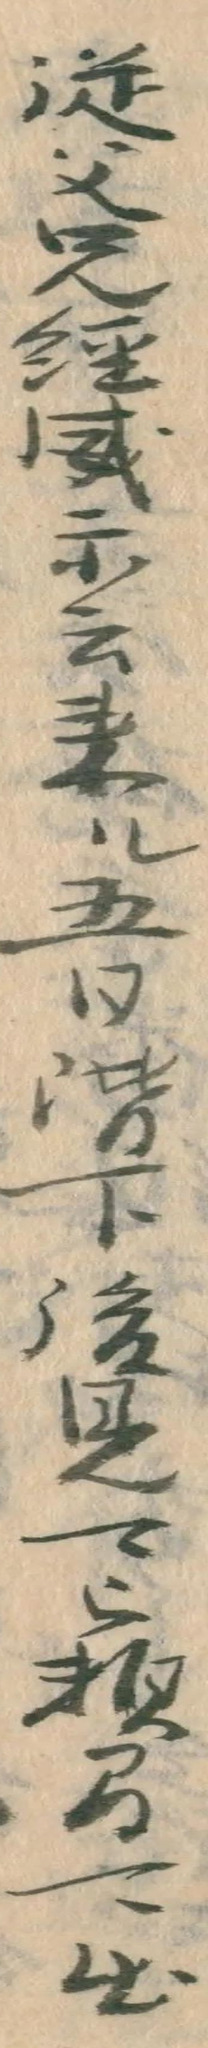従父兄経威示云、来ル五日、階下後見可被頼間、可出
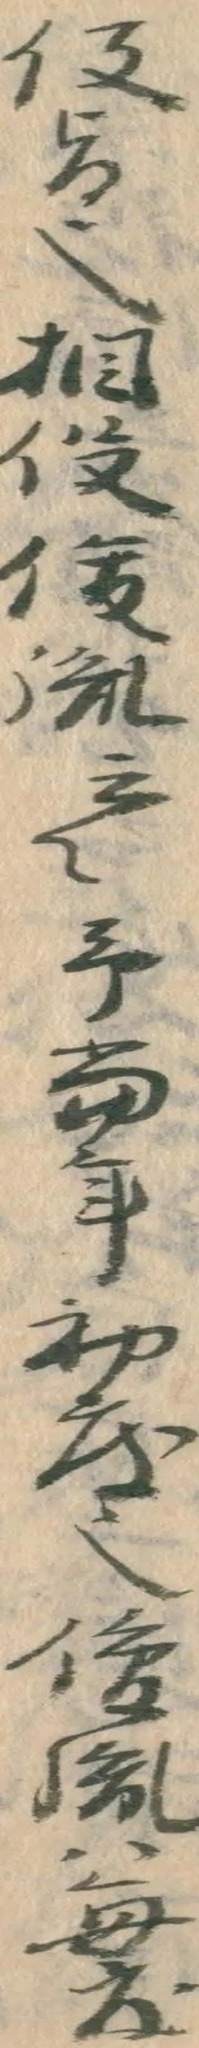役旨也、相役俊胤云々、予當年初度也、俊胤ハ毎度
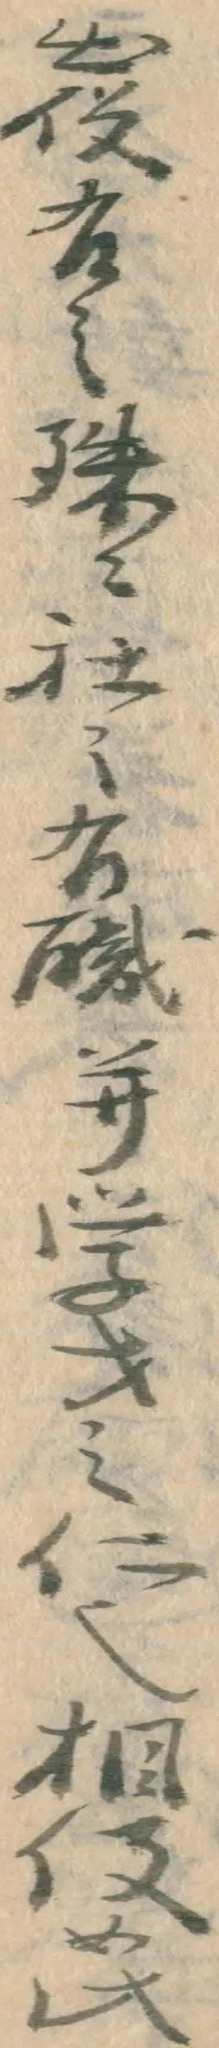出役有之、殊ニ社之有職幷学才之仁也、相役如此
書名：賀茂社記録. 第63冊
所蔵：国立国会図書館 National Diet Library, JAPAN
